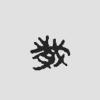歲
